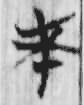未
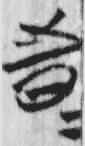之日
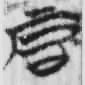石
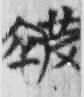被
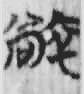裳
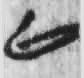㠯（以）
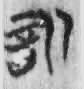訓（順）
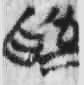爲
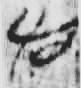左
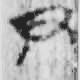尹
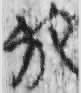{力它}
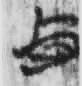貞
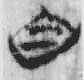自
